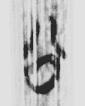公
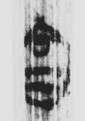○（答）
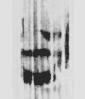曰
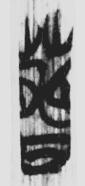薵（疇）
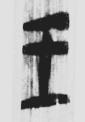王
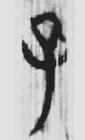子
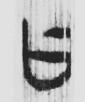曰
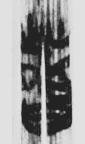薵（疇）
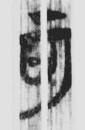可（何）
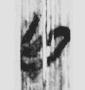㠯（以）
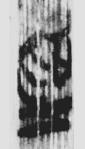爲
